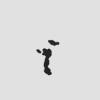亓（其）
